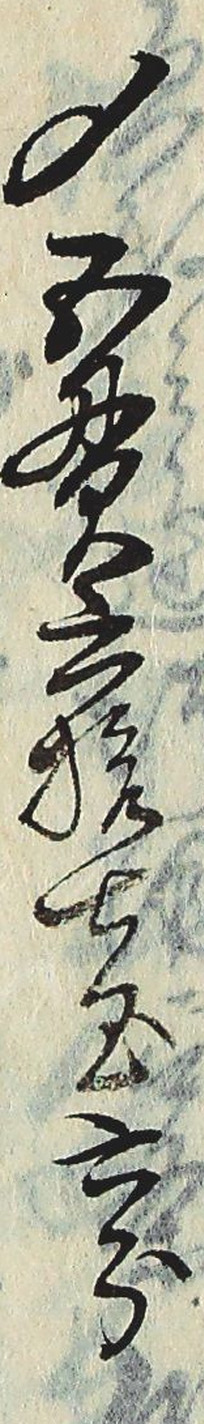〆五貫六拾七匁六分
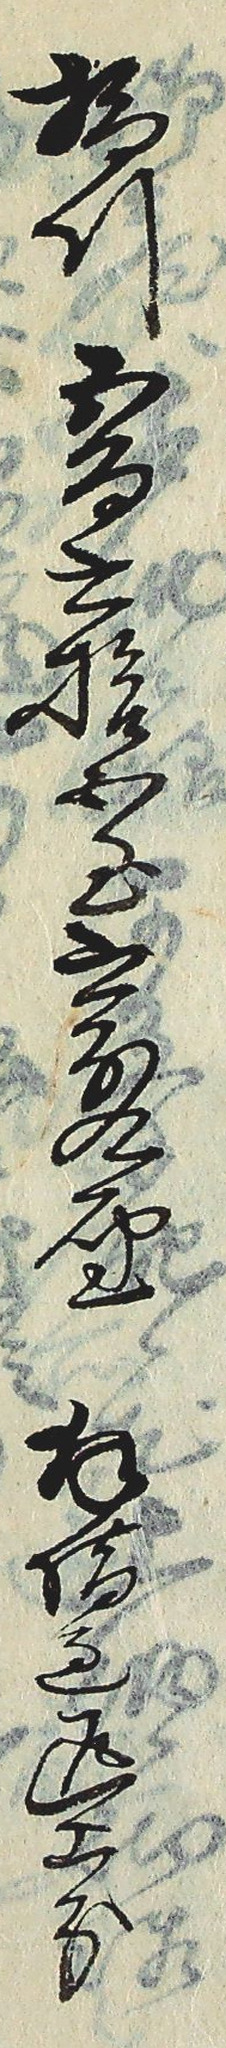指引五百六拾五匁六分九厘拝借過返上分
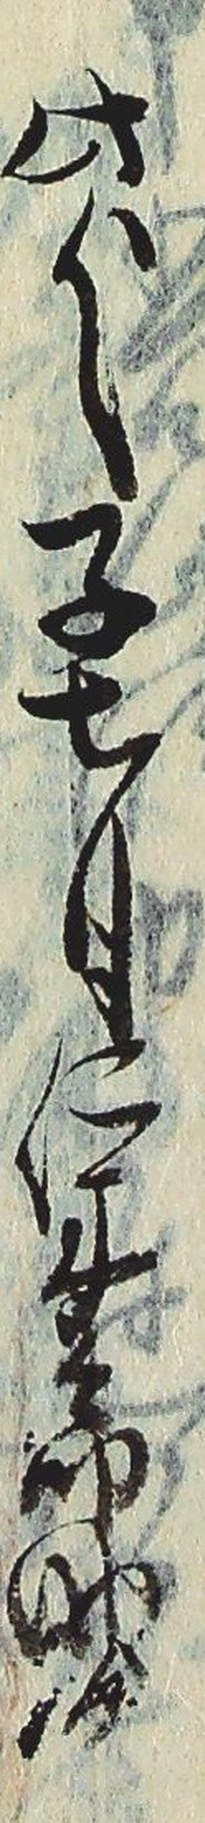此分子七月仁木節助ゟ
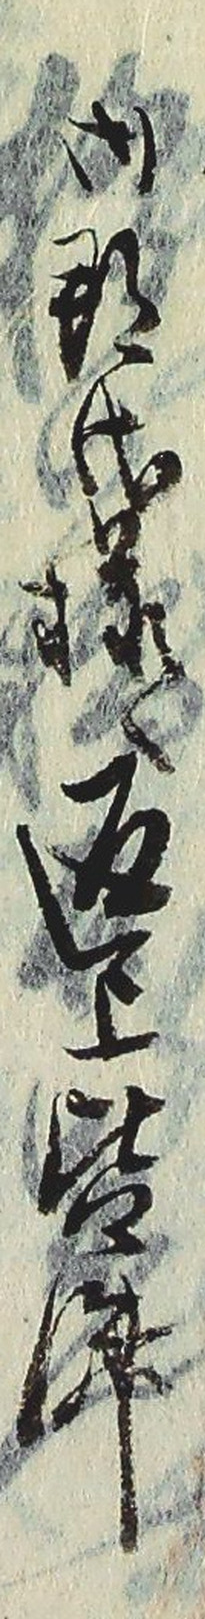御郡代様へ返上皆済
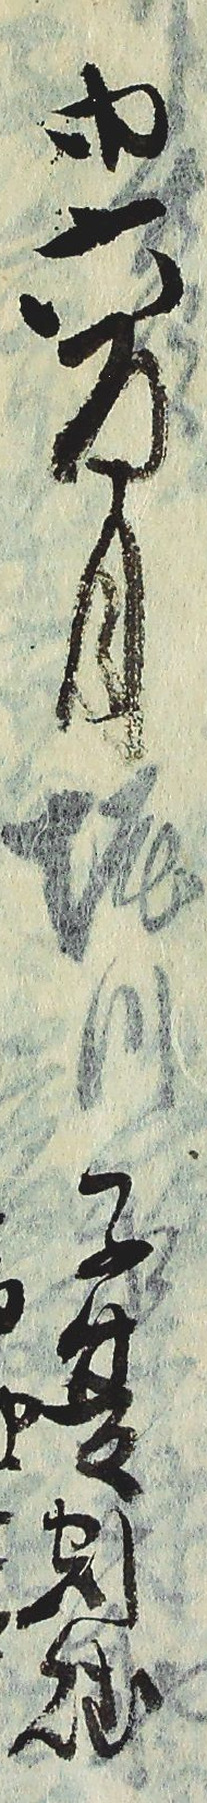内六百目子夏割賦
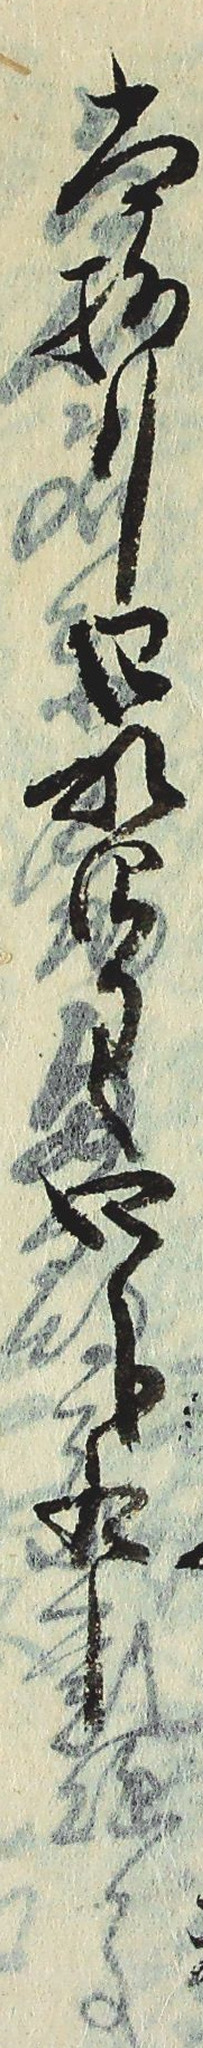尚指引四拾四匁四分九厘
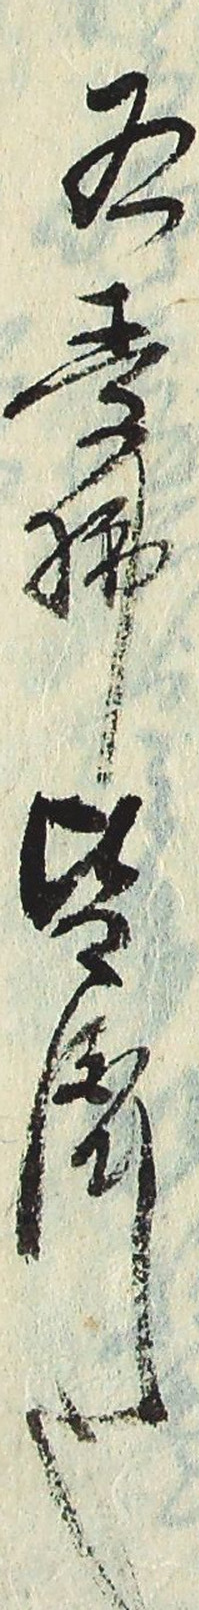右受払皆済也

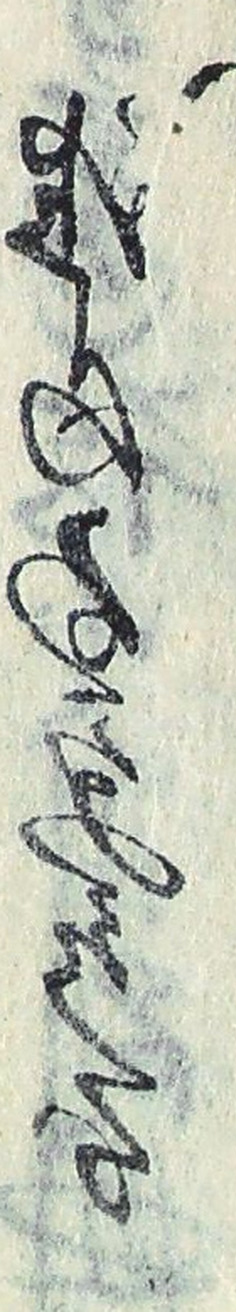十一月廿七日
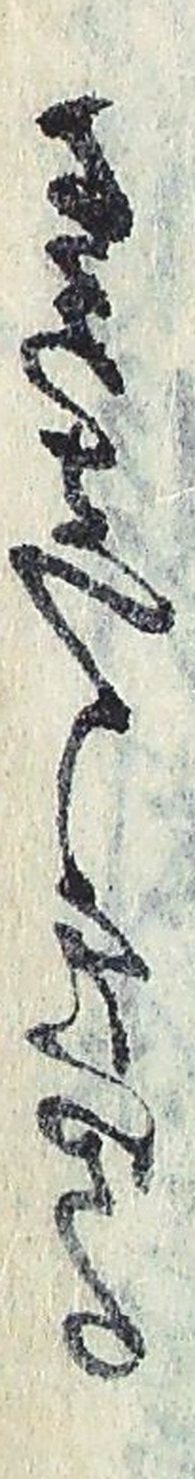十一月廿七日
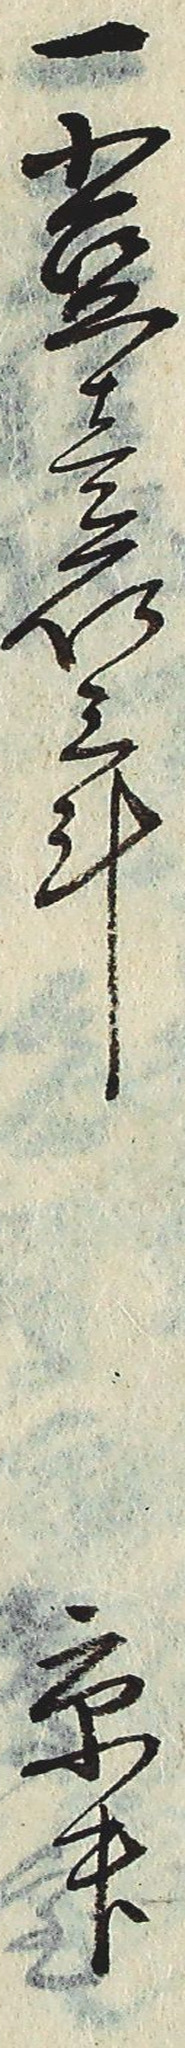一小豆壱石三斗京舛
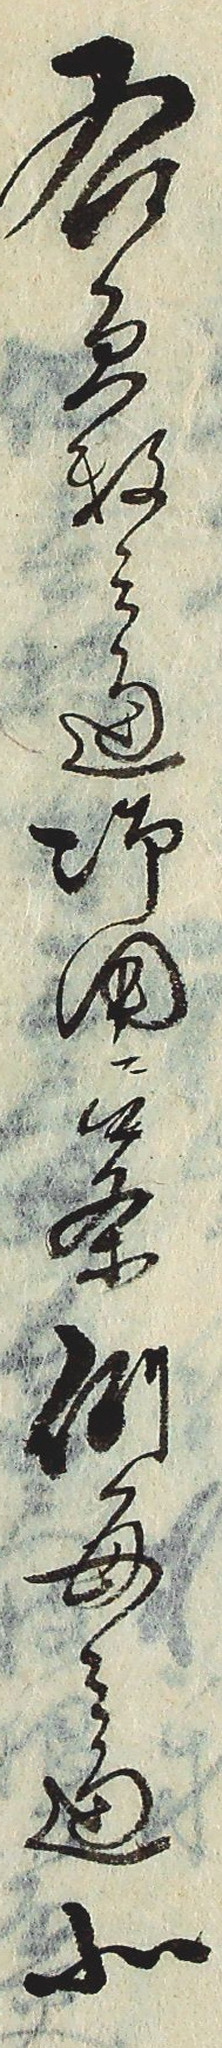右員数之通御用に候条例毎之通北
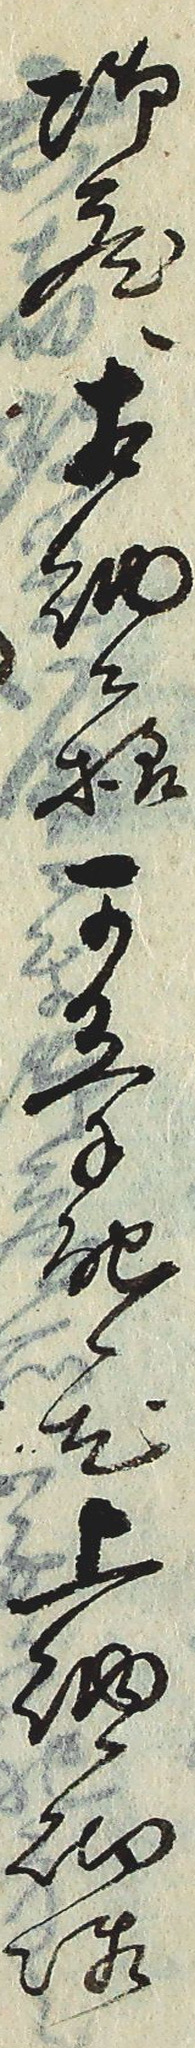御蔵へ相納候様可有手配候尤上納之砌御
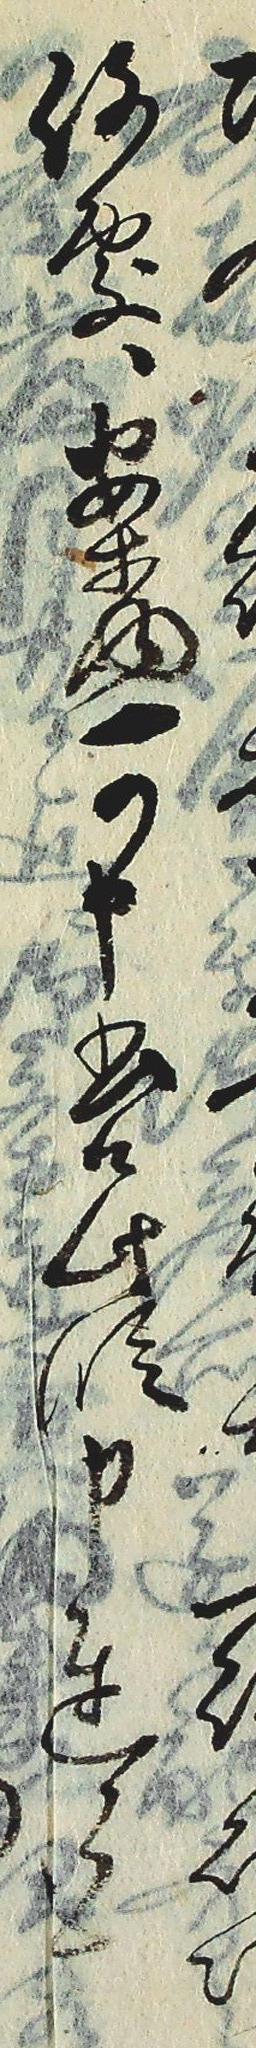役処へ案内可申出候此段申達候以上
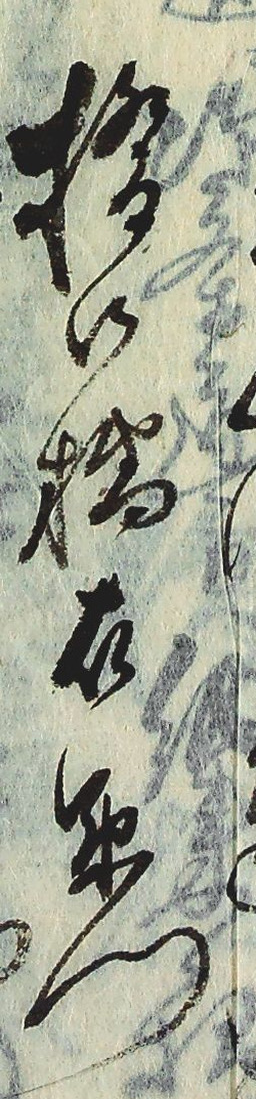橋口橘左衛門
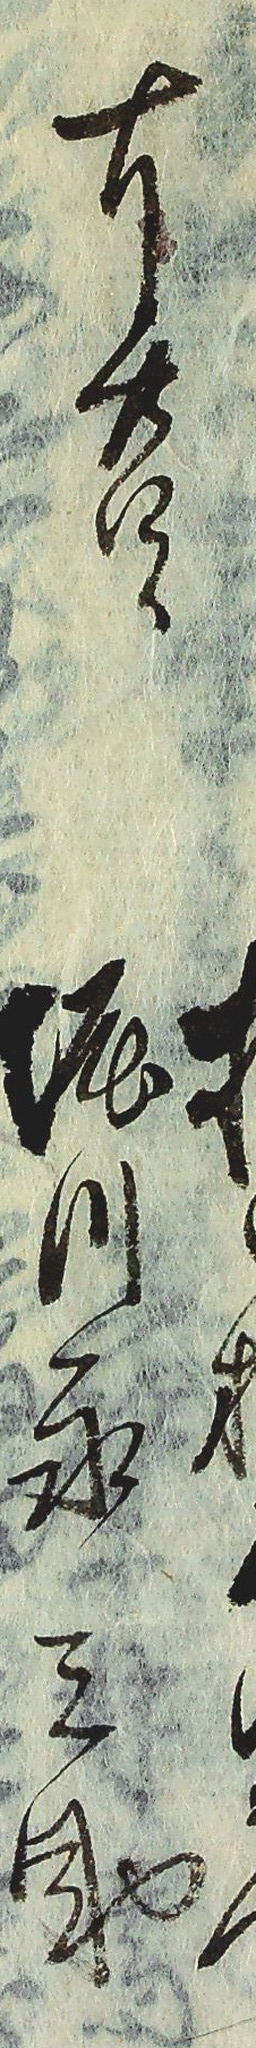十月廿四日堀川永之助
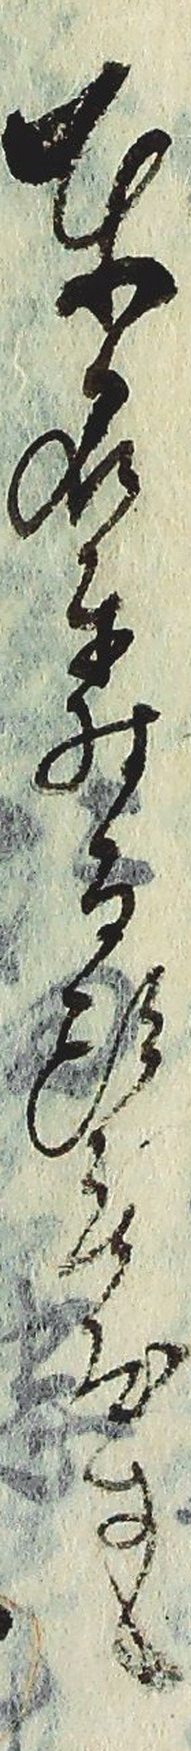東名東村与頭庄屋方へ
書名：名東郡中諸割賦元帳
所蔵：鳴門教育大学 Naruto University of Education
